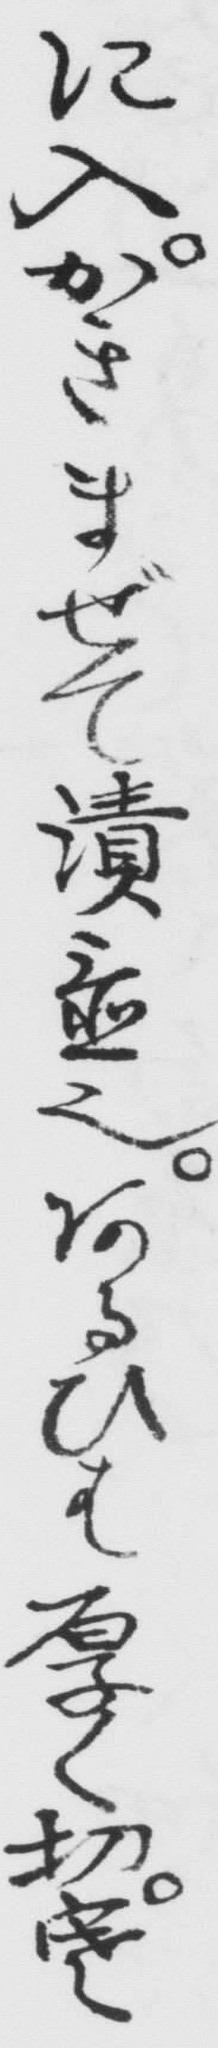に入。かきまぜて漬置也。あるひは厚く切。寒
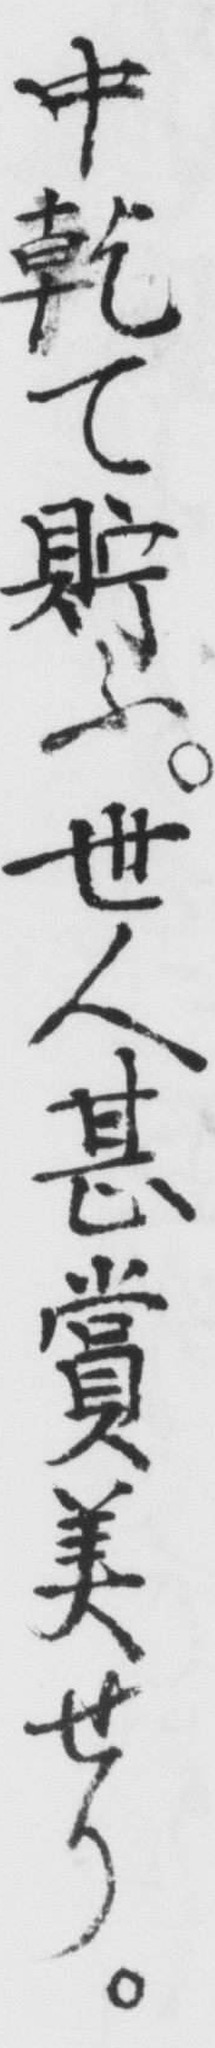中乾て貯ふ。世人甚賞美せり。
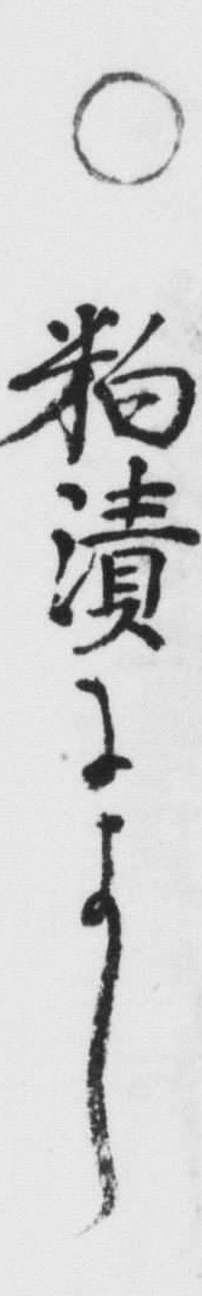○粕漬によし

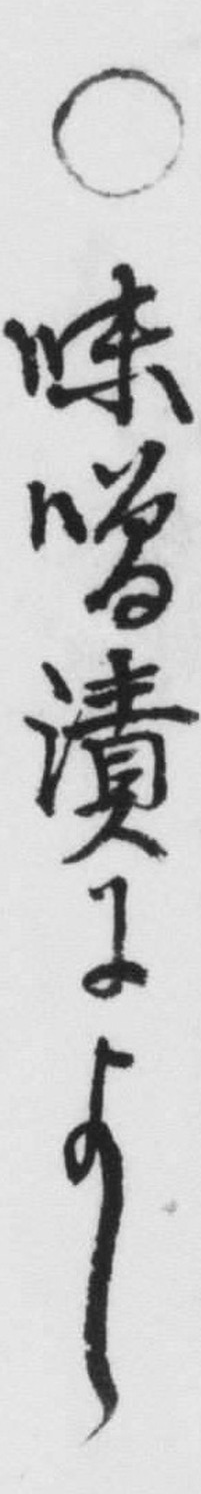○味噌漬によし
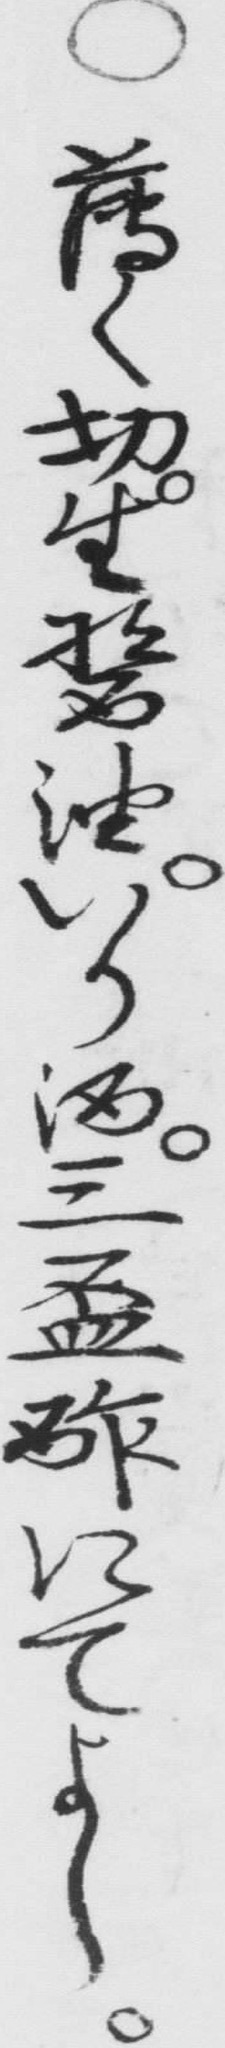○薄く切。生醤油。いり酒。三盃酢にてよし。
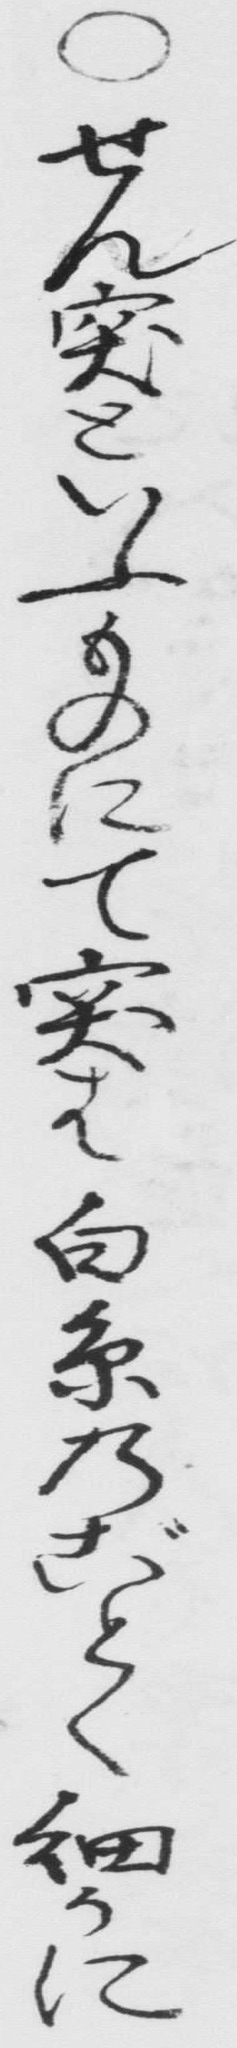○せん突といふものにて突は白糸のごとく細かに
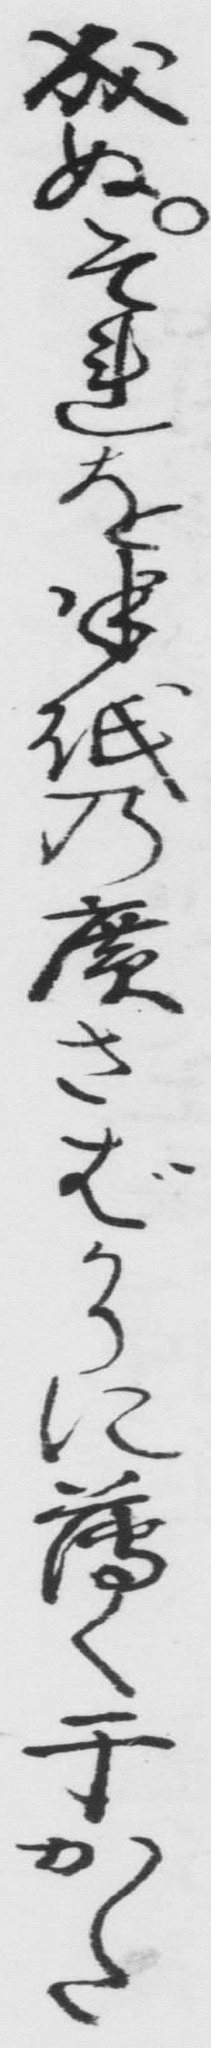成ぬ。それを半紙の広さばかりに薄く干かた
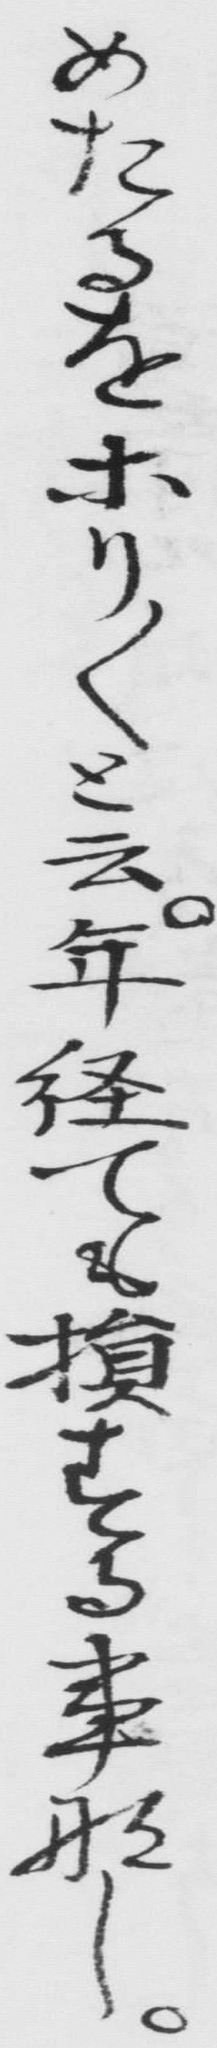めたるをホリ〳〵と云。年経ても損する事なし。
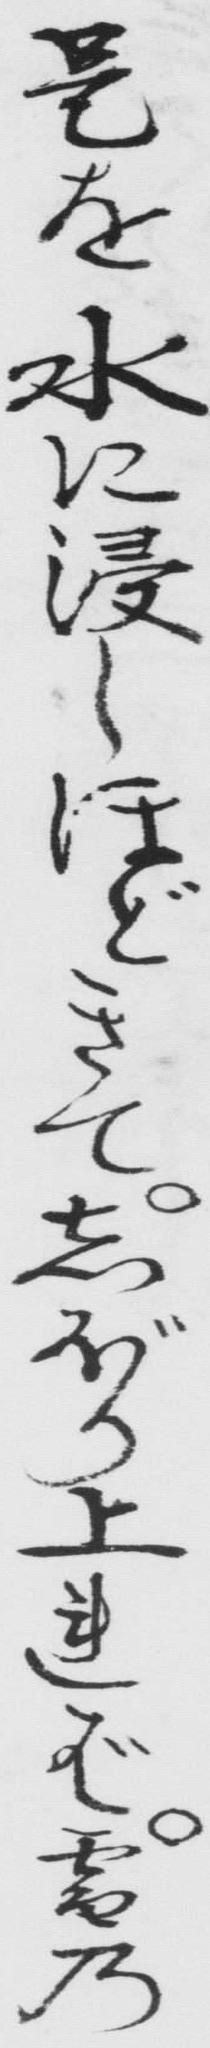是を水に浸しほどきて。しぼり上れば。雪の
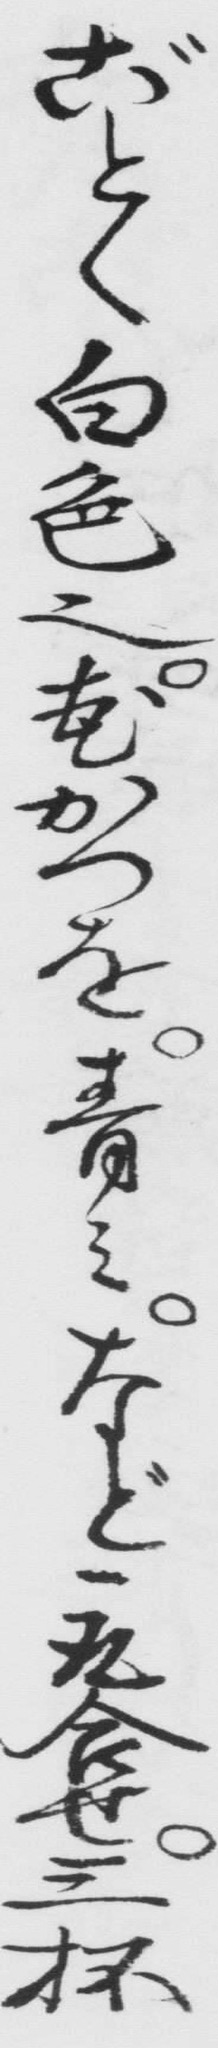ごとく白色也。老かつを。青ミ。など取合せ。三杯
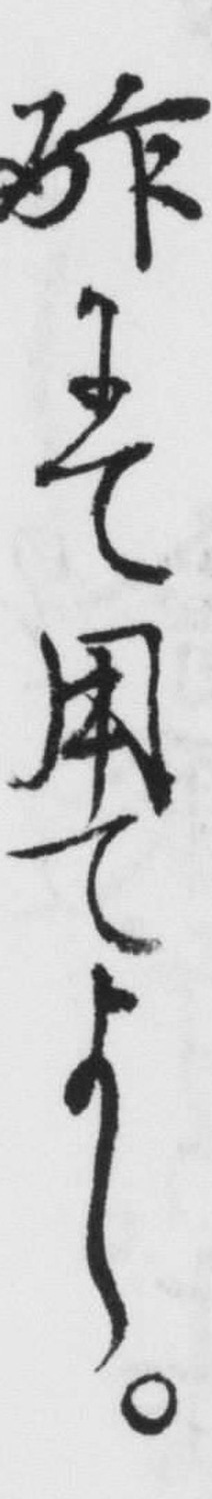酢にて用てよし。
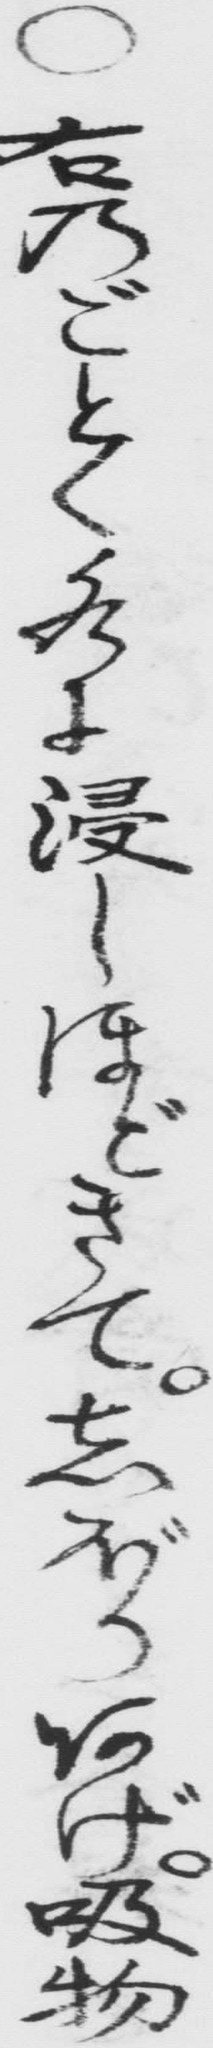○右のごとく水に浸しほどきて。しぼりあげ。吸物
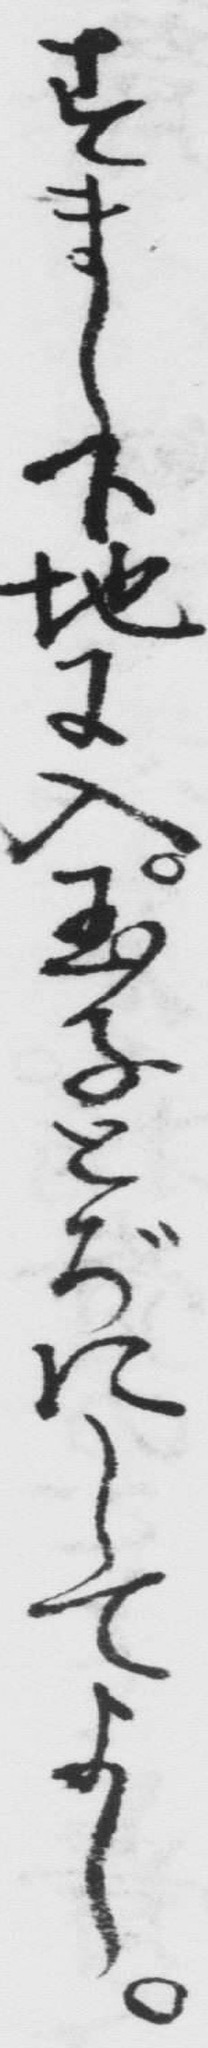すまし下地に入。玉子とぢにしてよし。
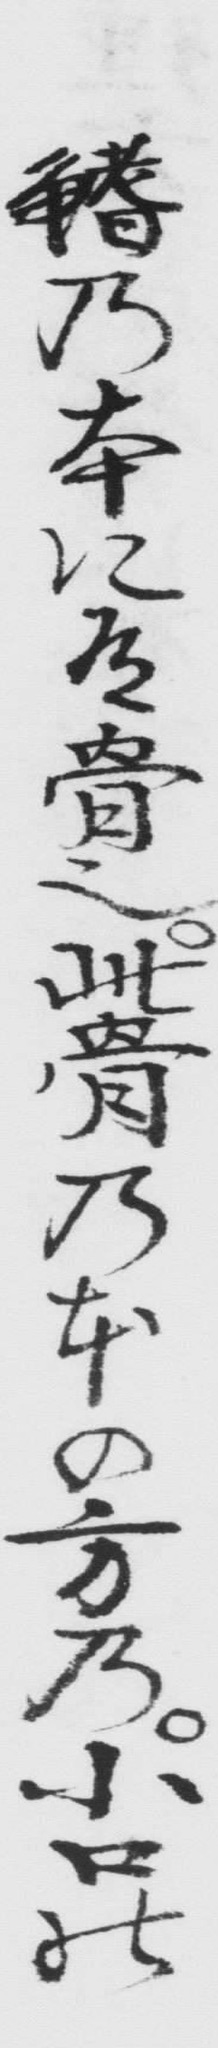扇骨鰭の本に有骨也。此骨の本の方の。小口の
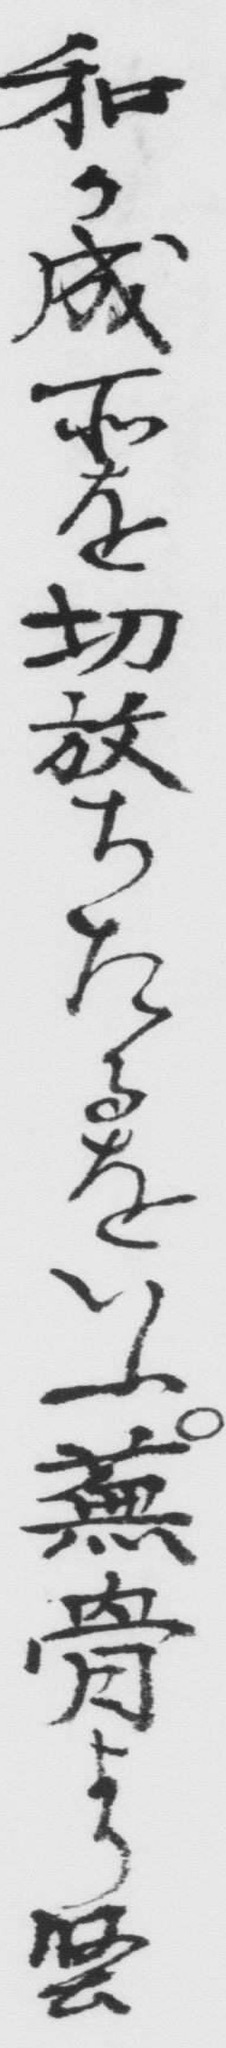和か成所を切放ちたるをいふ。蕪骨より堅
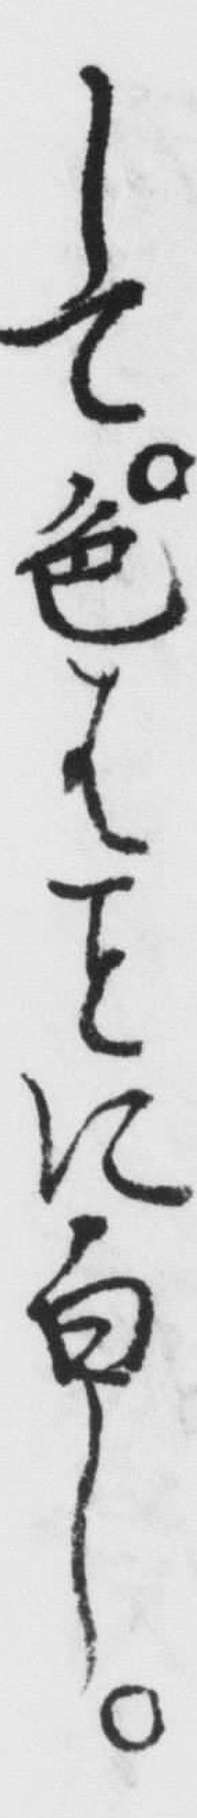して。色はことに白し。
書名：鯨肉調味方
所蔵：大阪府立大学学術情報センター 国文学研究資料館
